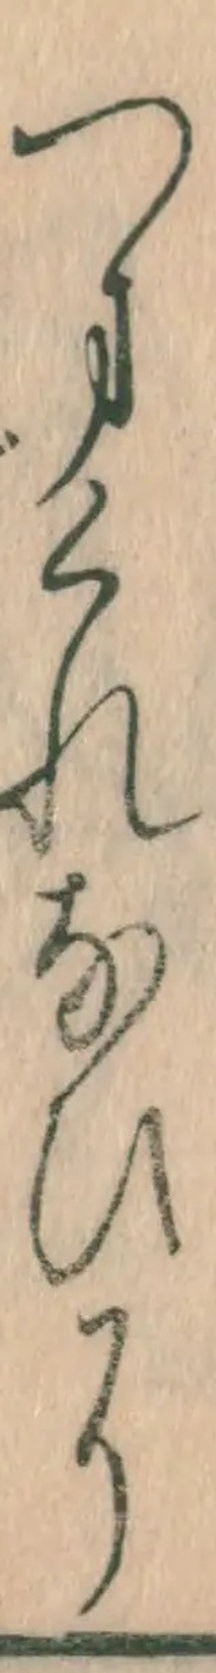つまくれなひに
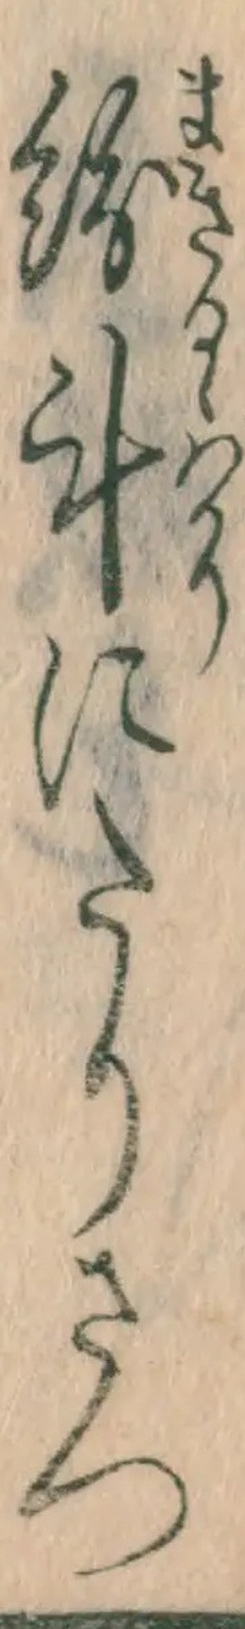紛斗にたりさつ
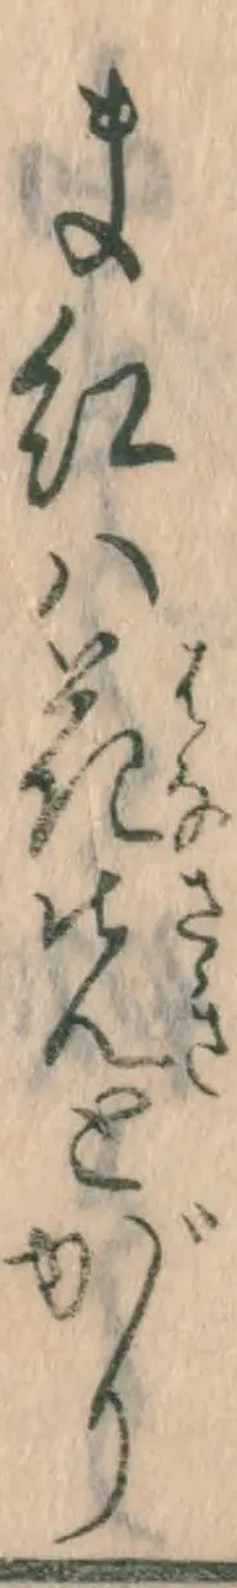ま紅は花先とがり
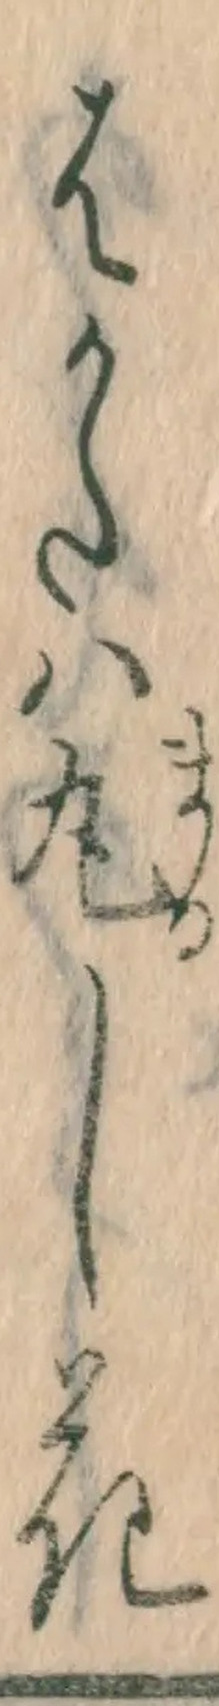はかたは丸し花
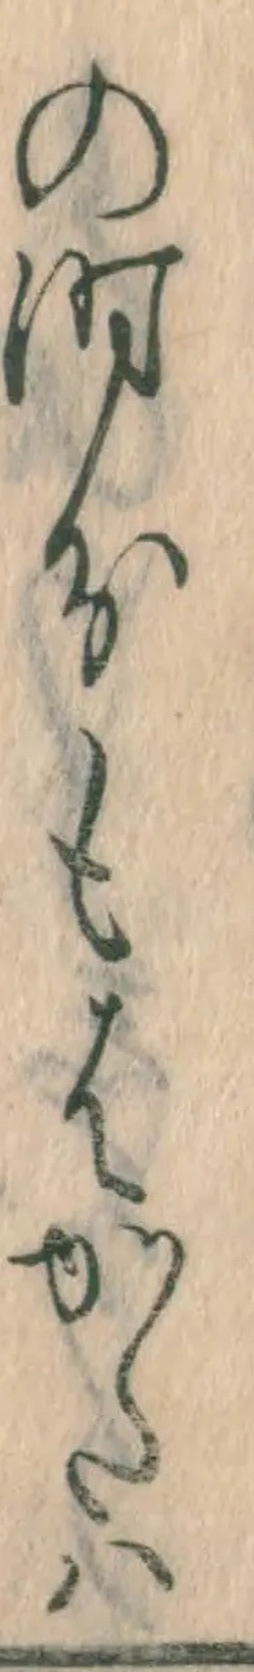の時分もはかたは
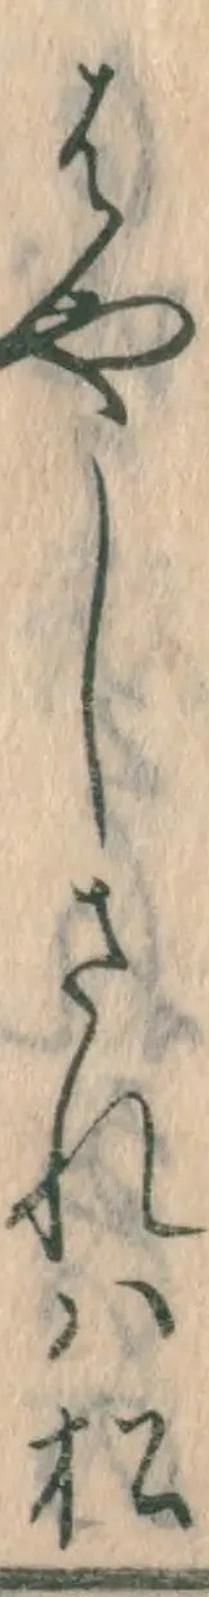はやしされは松
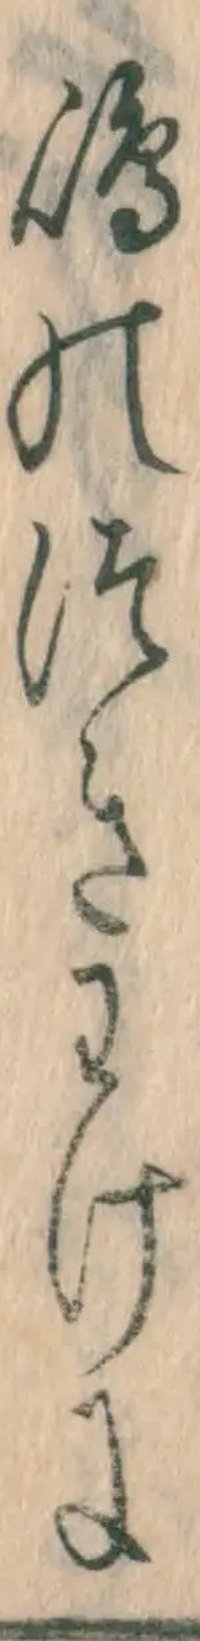嶋のつきわけに
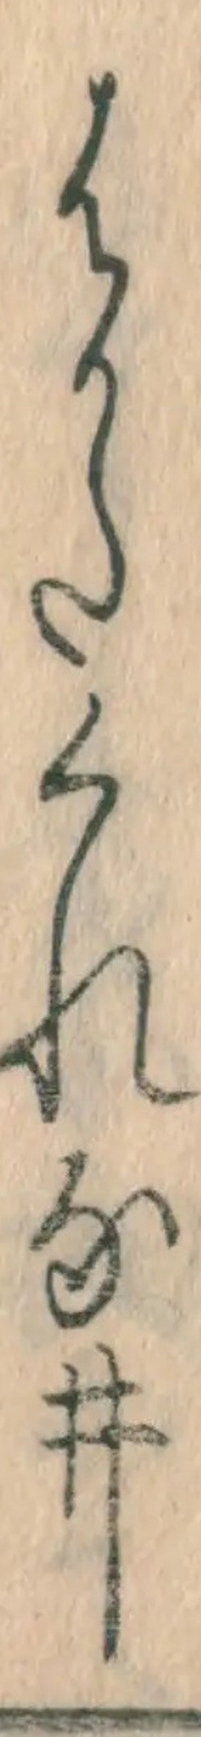はかたくれない
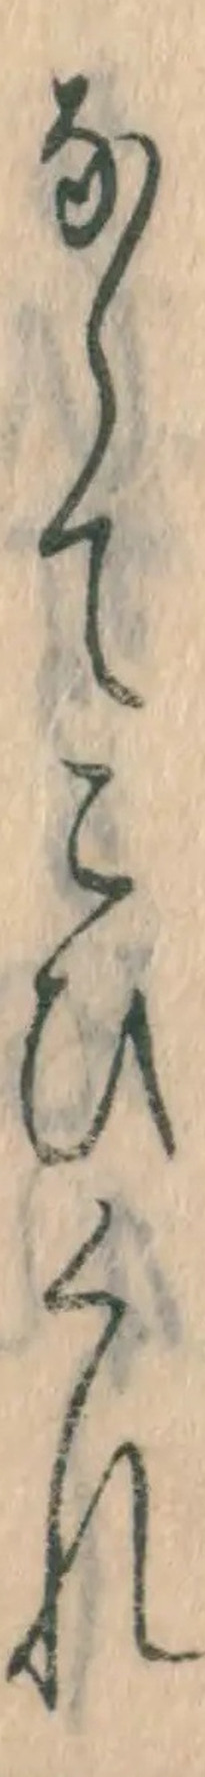ならてこひくれ

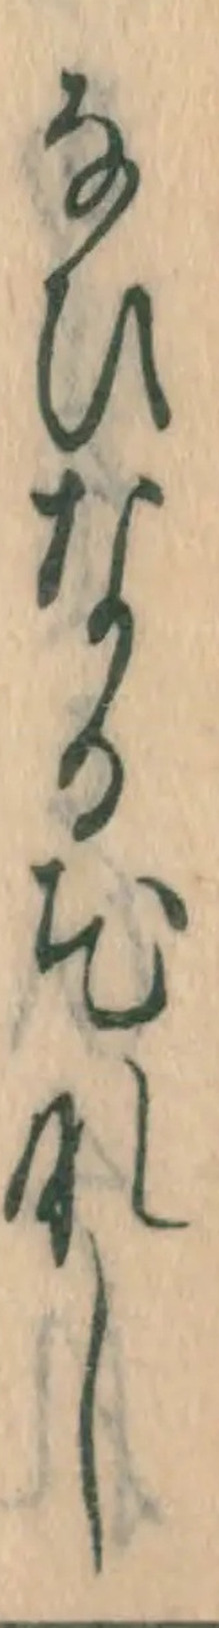なひなる花なし
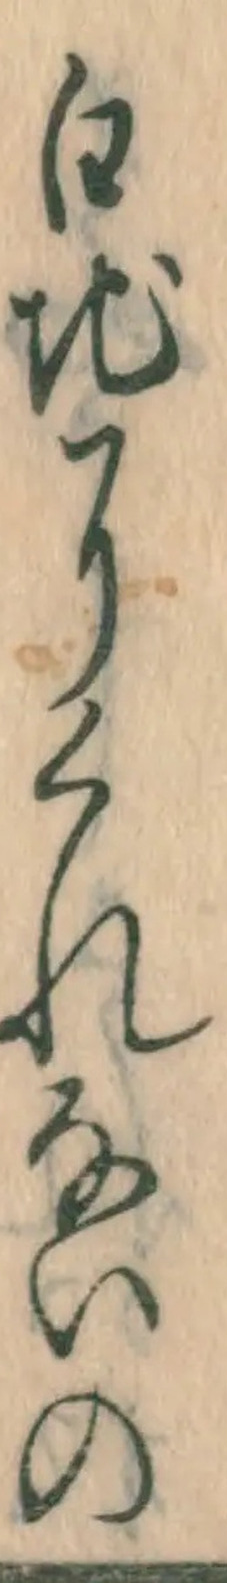白地にくれないの
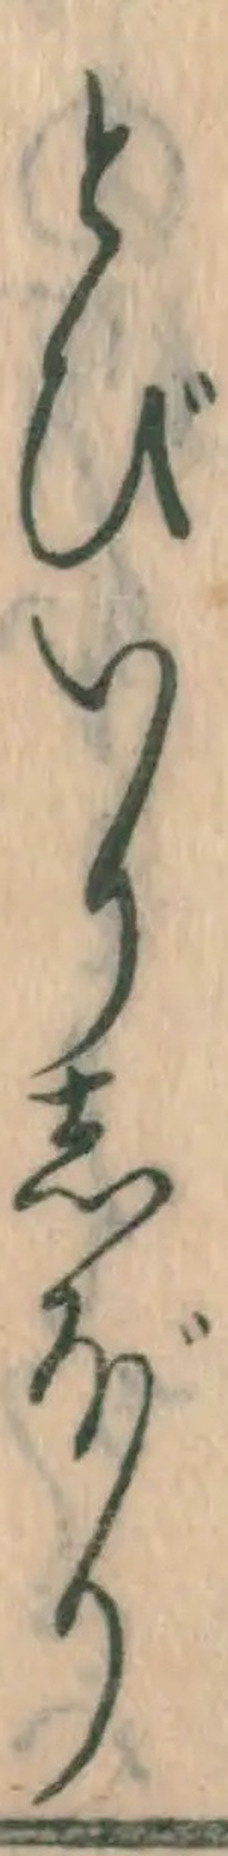とびいりしぼり
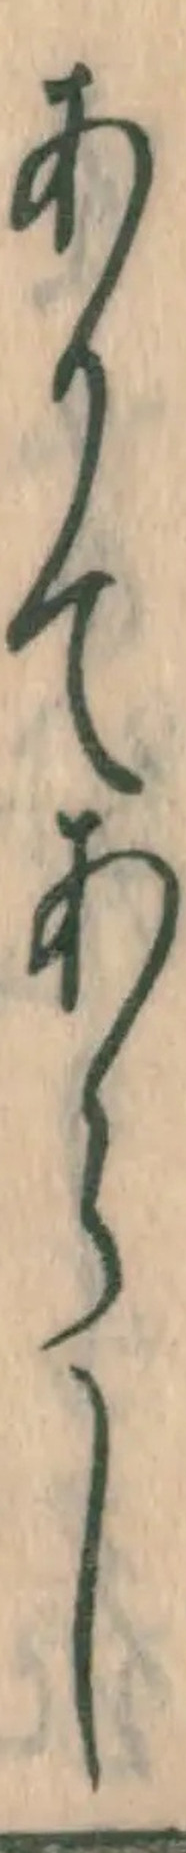ありてあらし
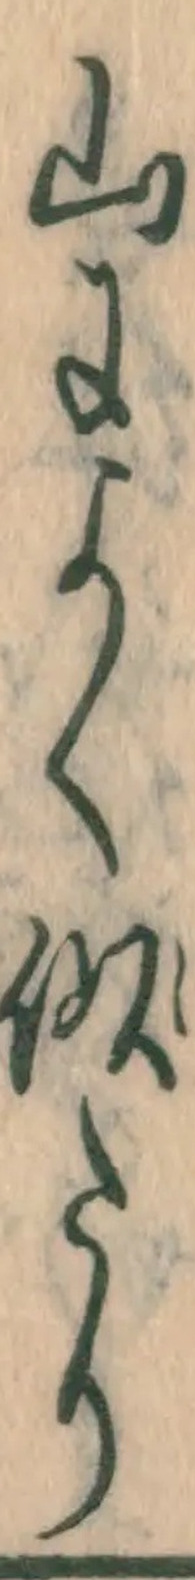山によく似たり
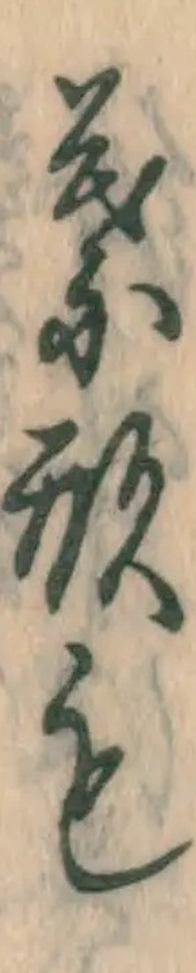葉形も
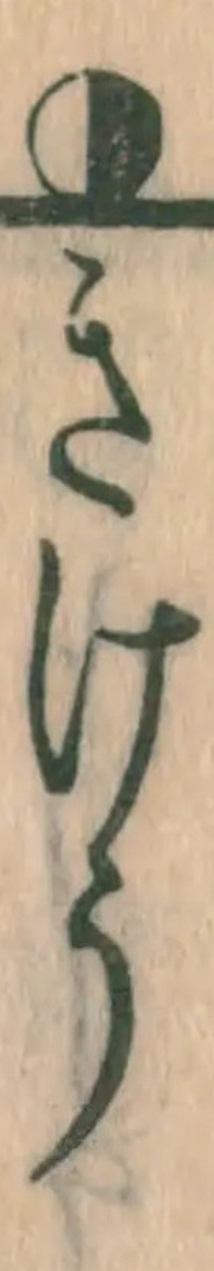きけう
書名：錦繍枕 5巻. [4]
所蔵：国立国会図書館 National Diet Library, JAPAN
